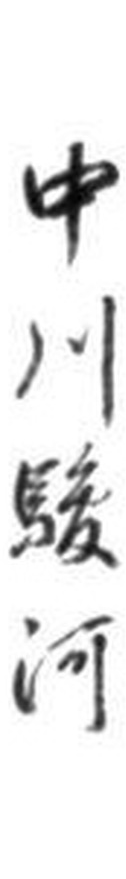中川駿河
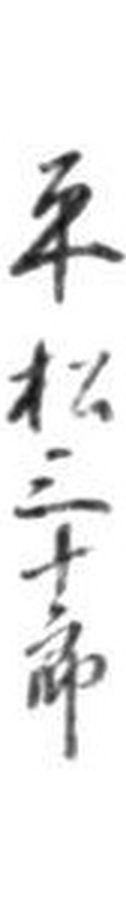平松三十郎
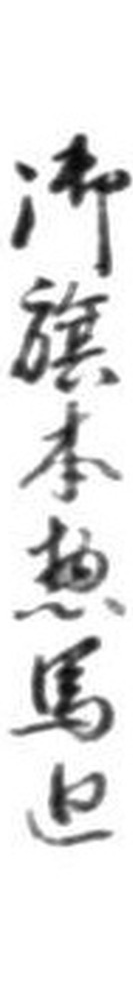御旗本惣馬廻
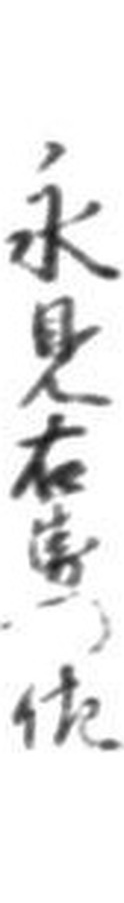永見右衛門佐
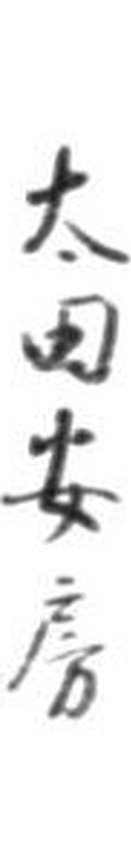太田安房
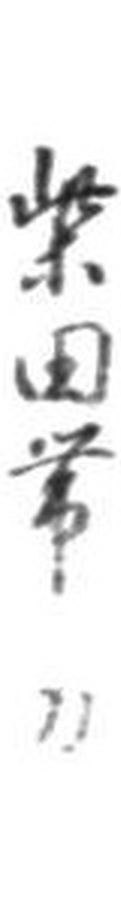柴田帯刀
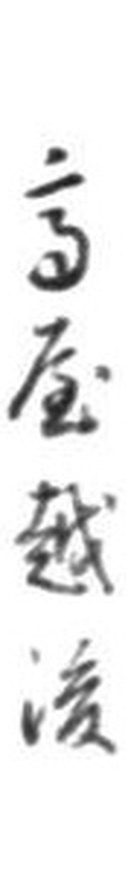高屋越後
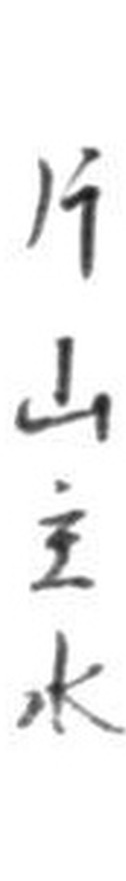片山主水

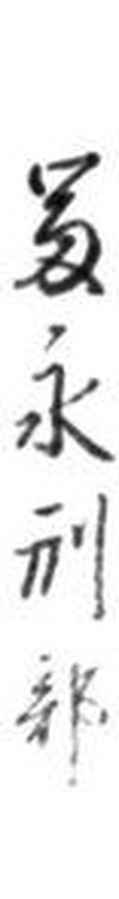富永刑部
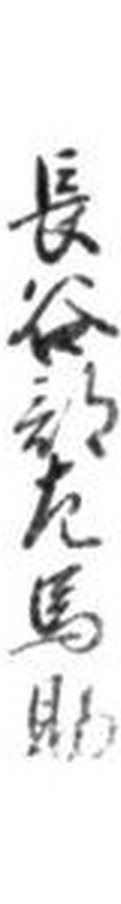長谷部左馬助
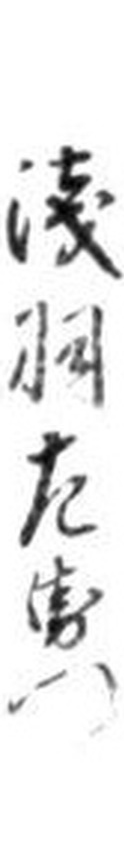浅羽左衛門
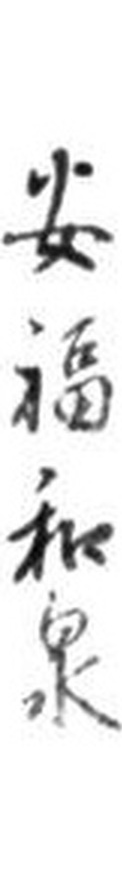安福和泉
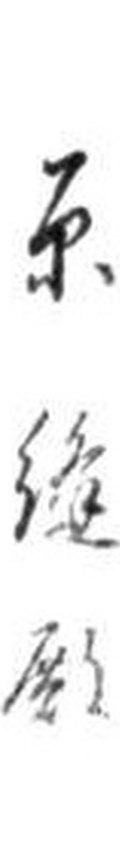原縫殿
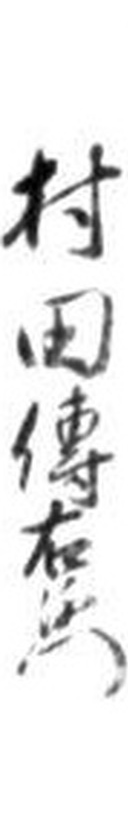村田伝右衛門
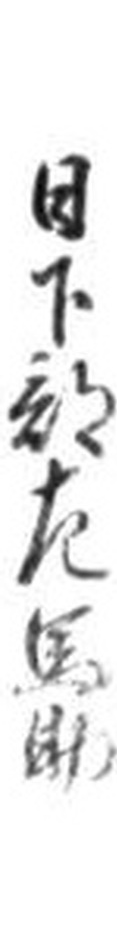日下部左馬助
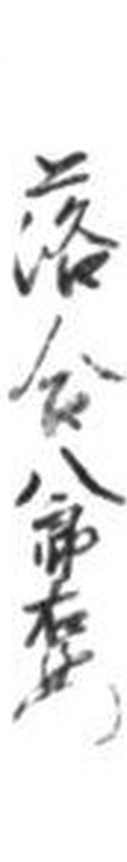落合八郎右衛門
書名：家譜 二 忠直公 従文禄四年到慶安四年
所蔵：福井県文書館 Fukui Prefectural Archives
